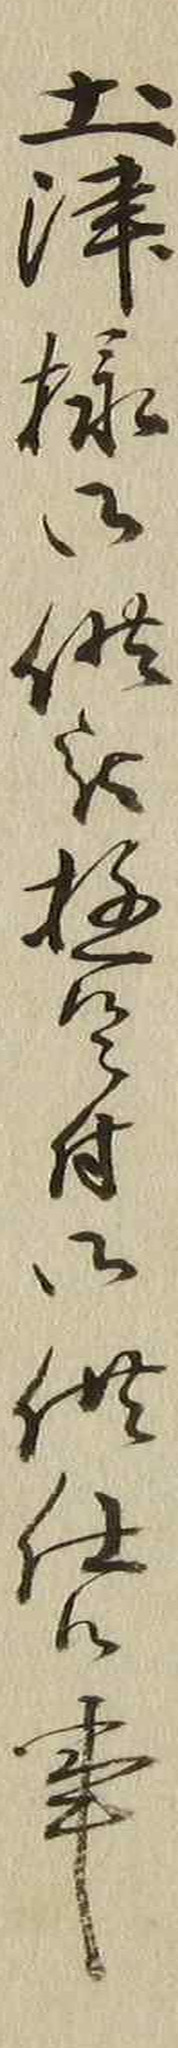土津様御供被遊候ニ付御供仕候事
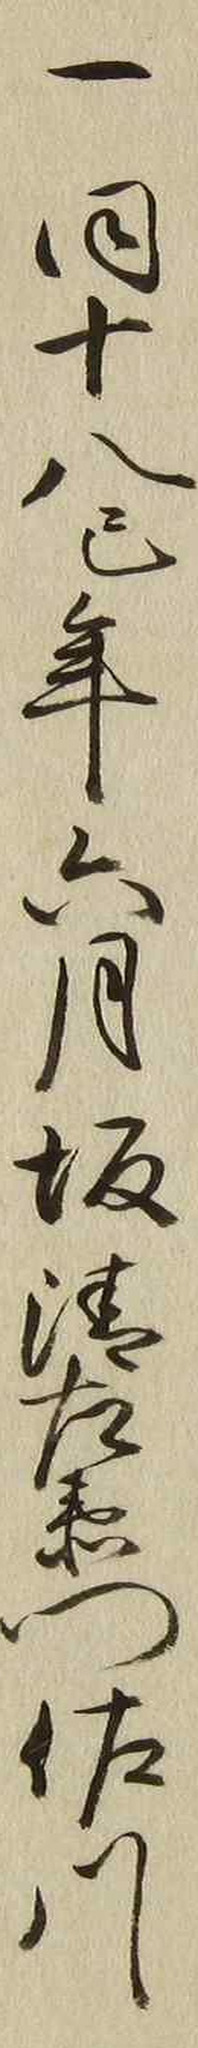一同十八巳年六月坂清左衛門佐川
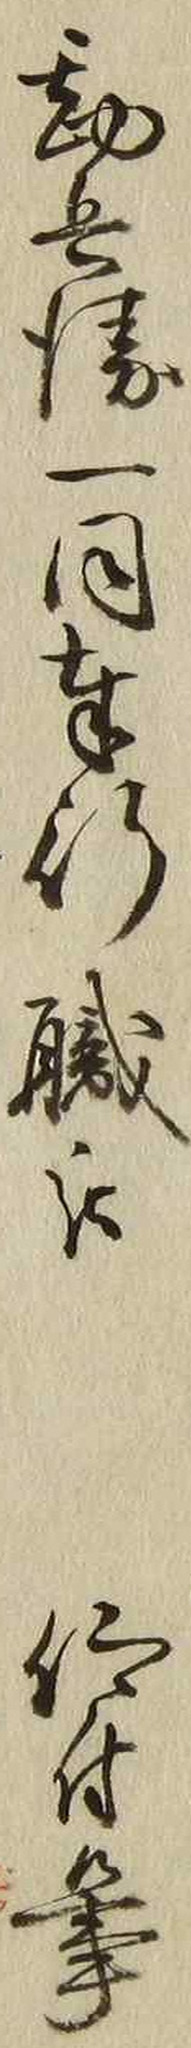勘兵衛一同奉行職被仰付候事
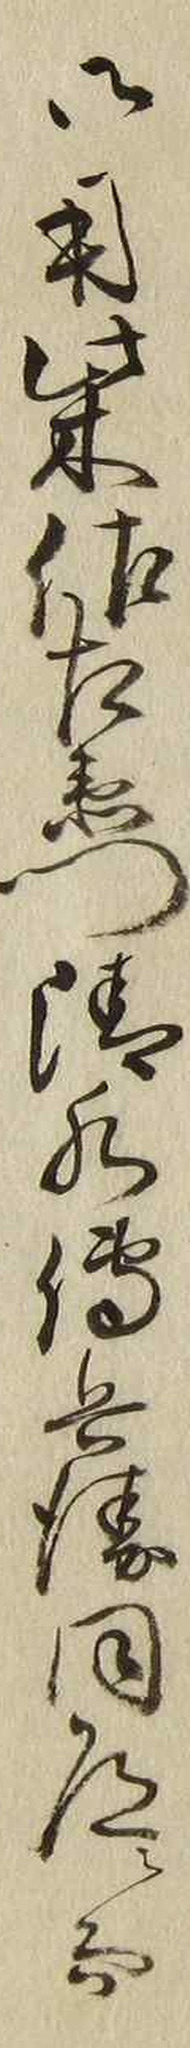御用柴佐左衛門清水伝兵衛同道ニ而
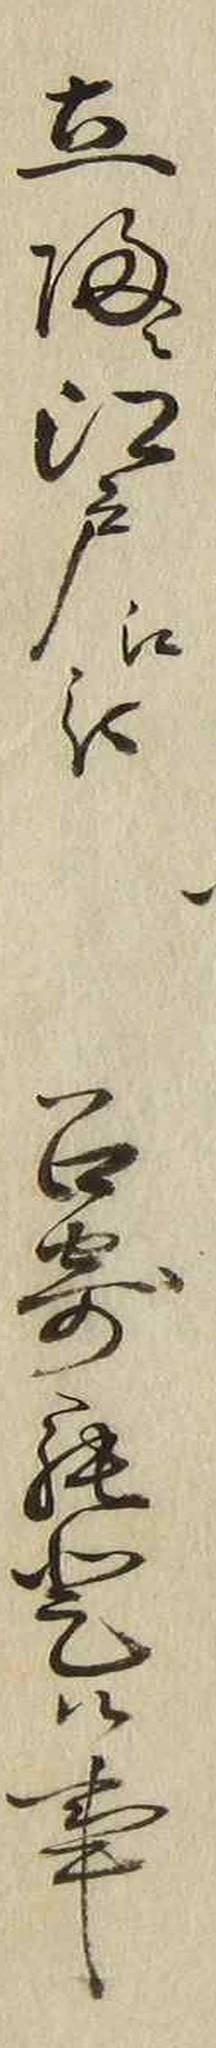立帰ニ江戸江被召寄罷登候事
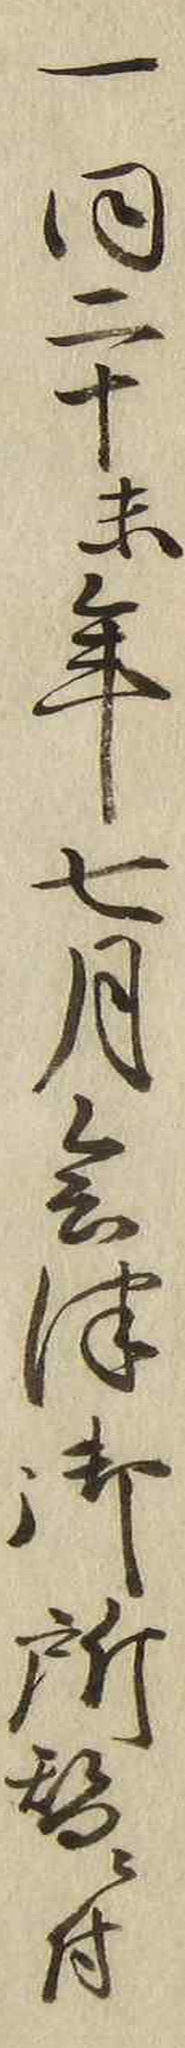一同二十未年七月会津御所替ニ付
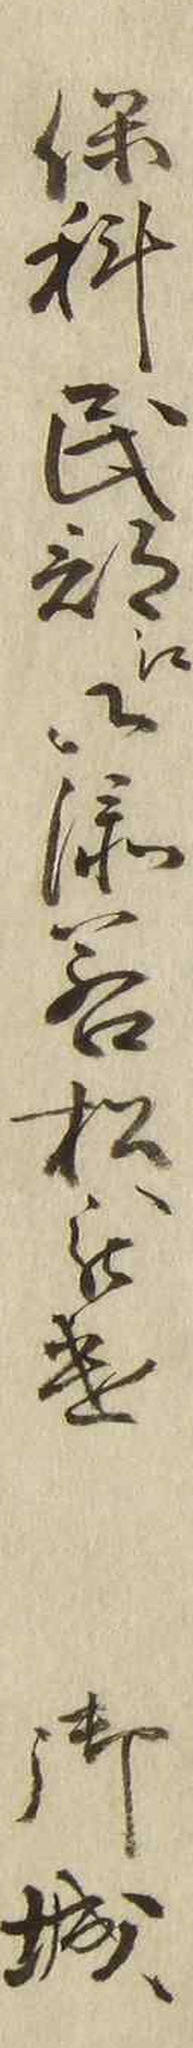保科民部江御添若松へ被遣御城
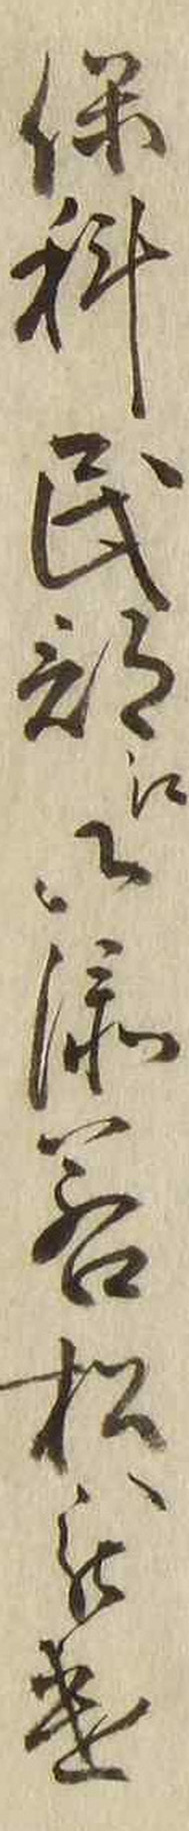保科民部江御添若松へ被遣御城

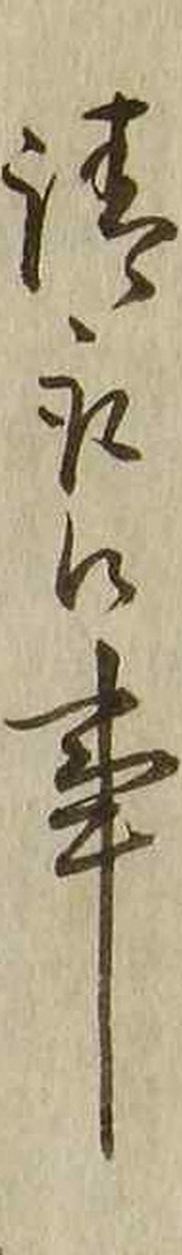請取候事
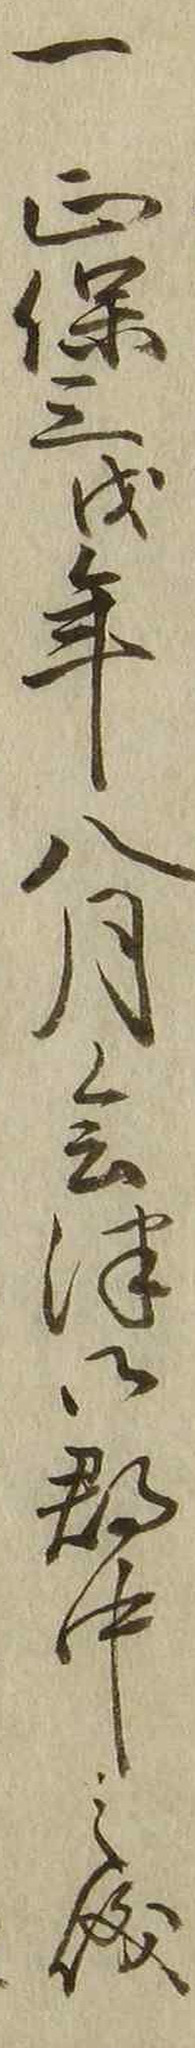一正保三戌年八月会津御郡中之儀
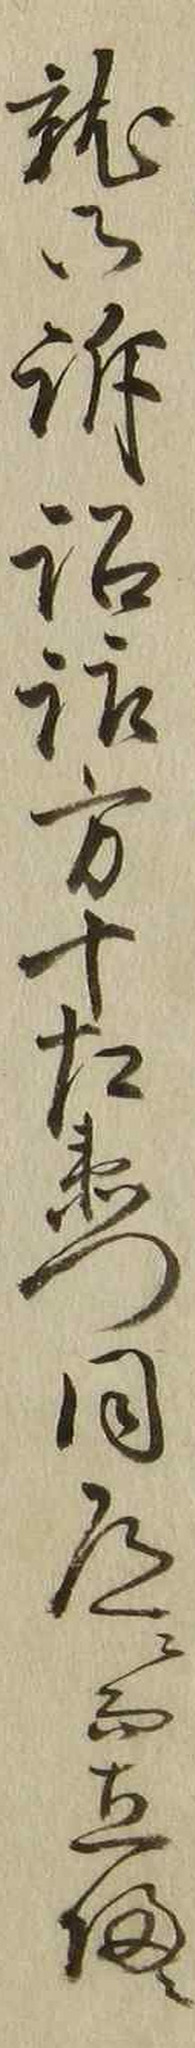就御訴訟諏方十左衛門同道ニ而立帰ニ
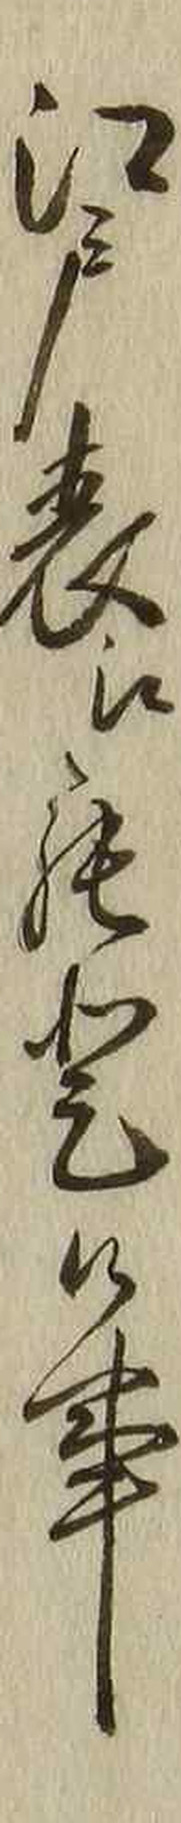江戸表江罷登候事
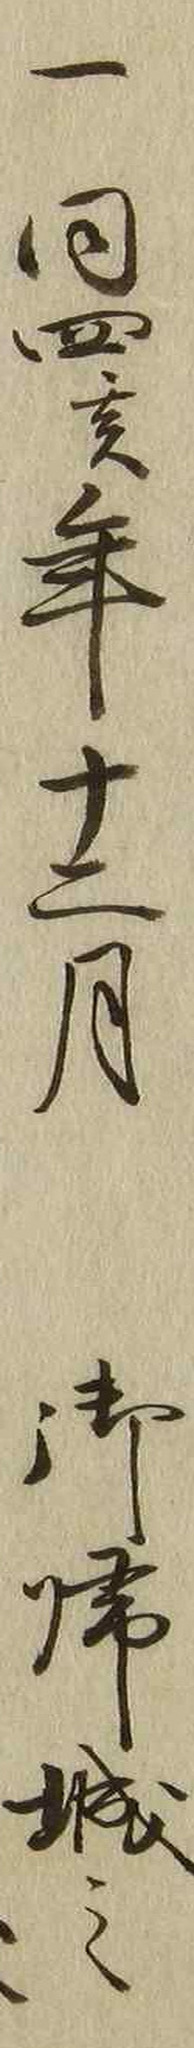一同四亥年十二月御帰城之
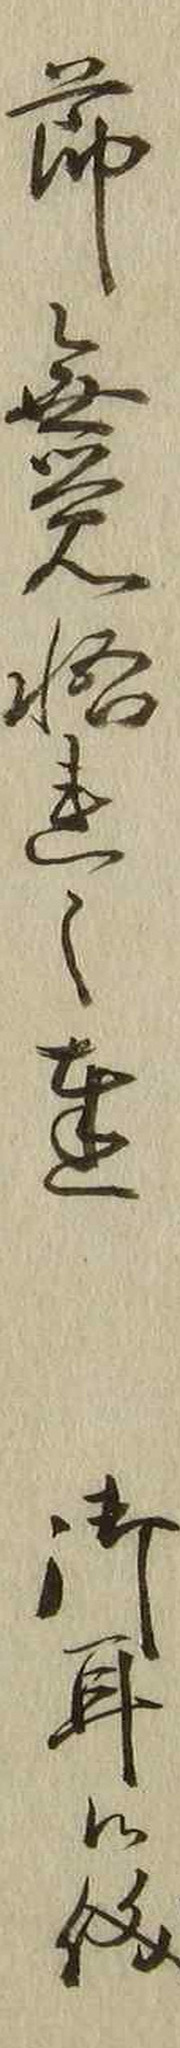節無覚悟連之達御耳候儀
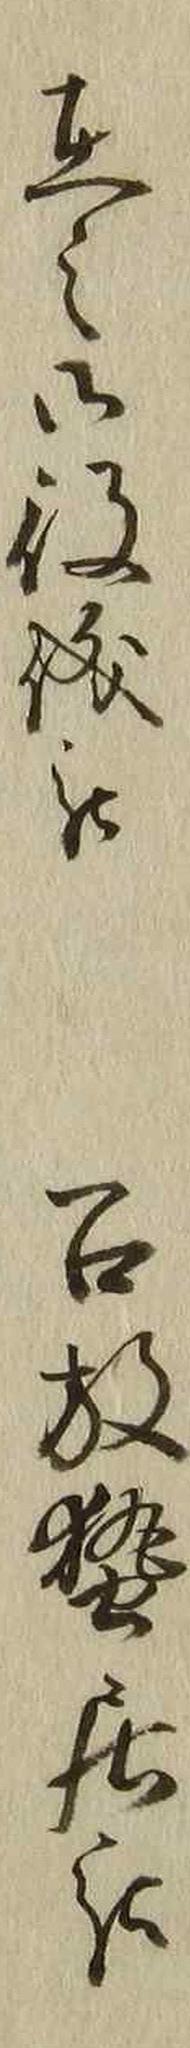在之御役儀被召放蟄居被
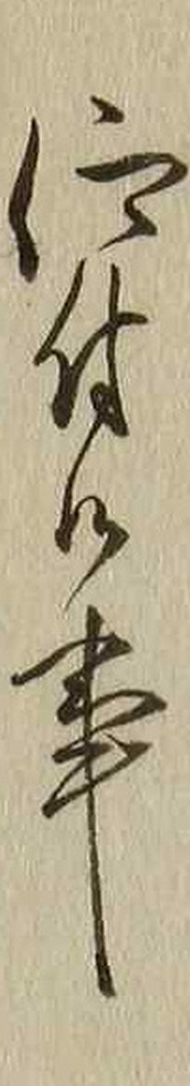仰付候事
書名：諸士系譜　巻之60　と之部3
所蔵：会津若松市立会津図書館
